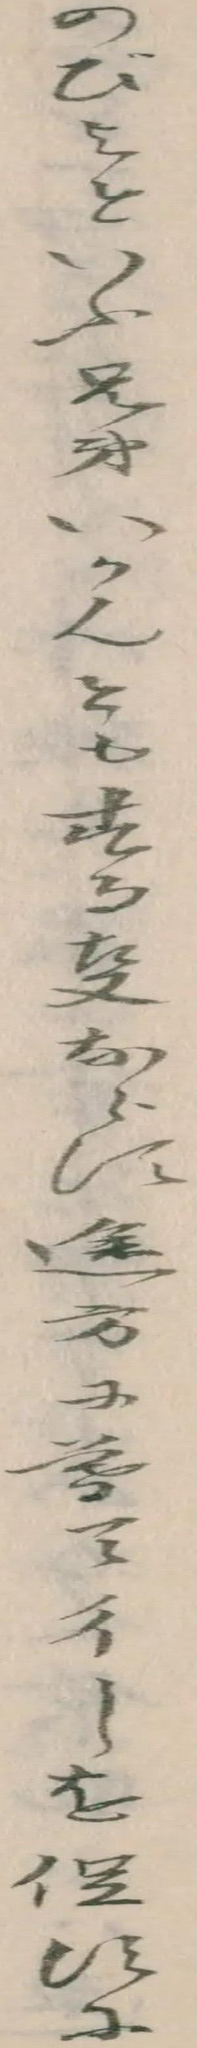のびよといふ兄弟いかんともする事ならす途方に暮て彳しを促すに
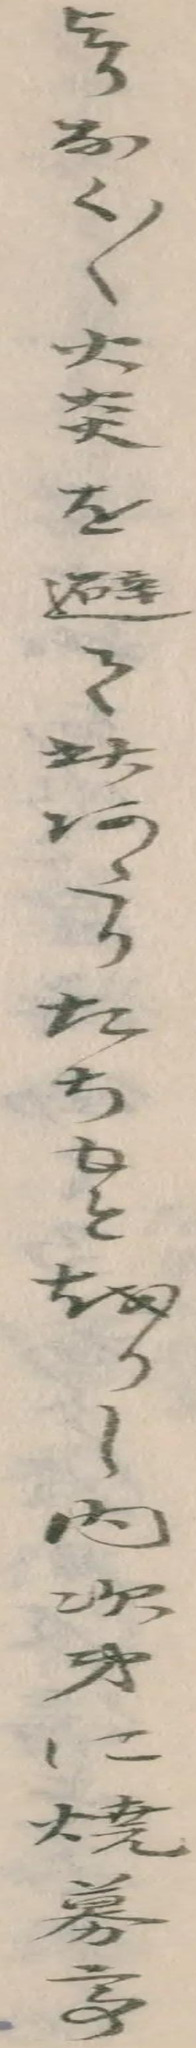よりなく〳〵火炎を避て此あたりたちもとをりし内次第に焼募て
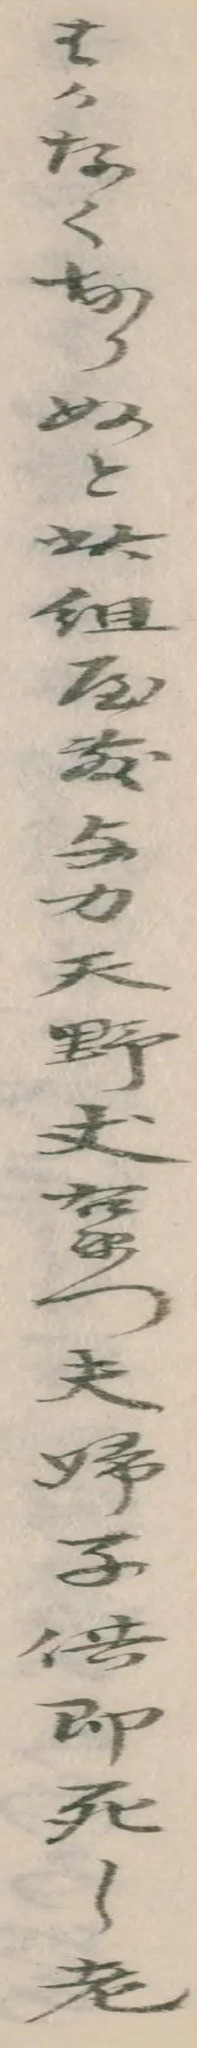はかなくなりぬと此組屋敷与力天野丈右衛門夫婦子供即死し老
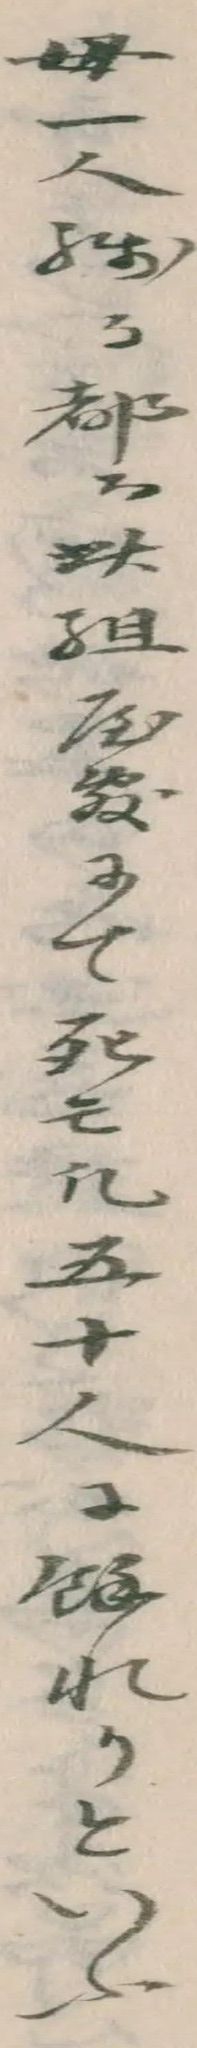母一人残る都而此組屋敷にて死亡凡五十人に余れりといふ
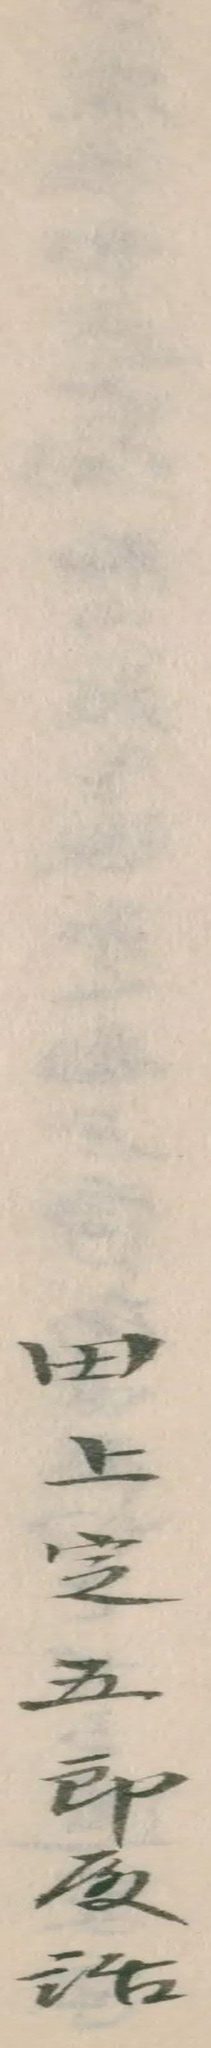田上定五郎殿話
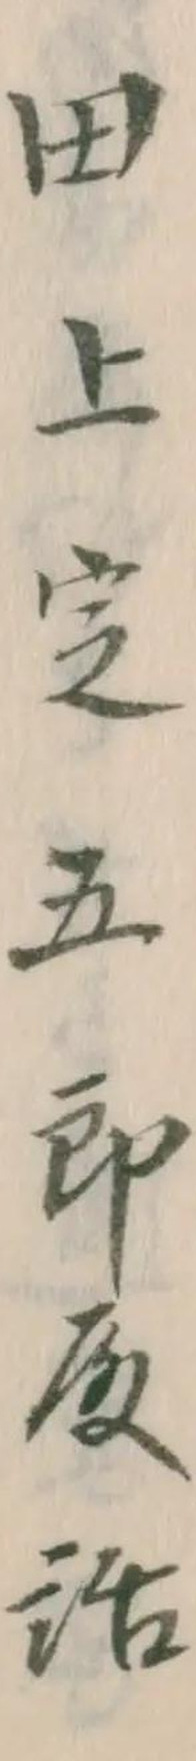田上定五郎殿話
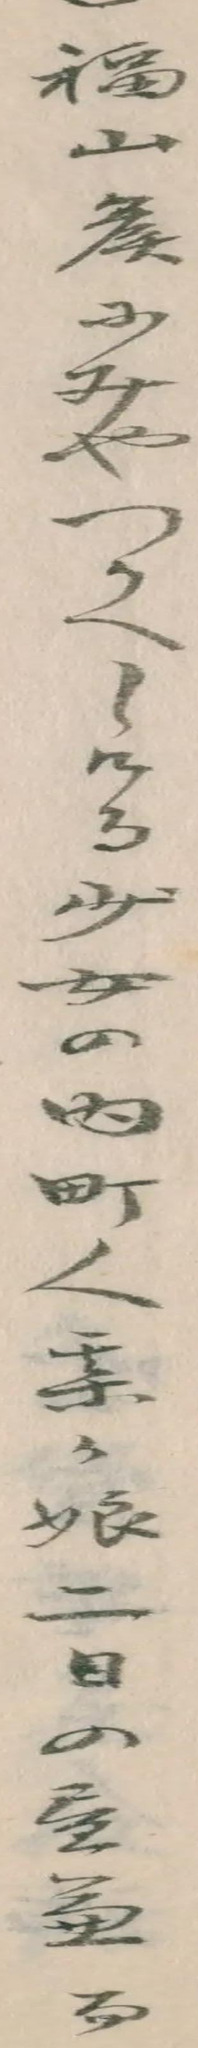〇福山侯にみやつかへしける少女の内町人某か娘二日の昼兼て
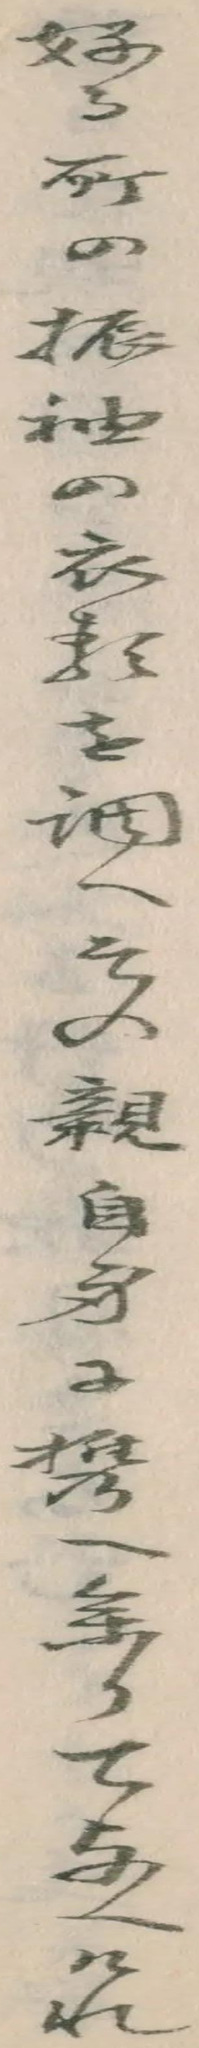好る所の振袖の衣類を調へその親自身に携へ参りて与へけれ
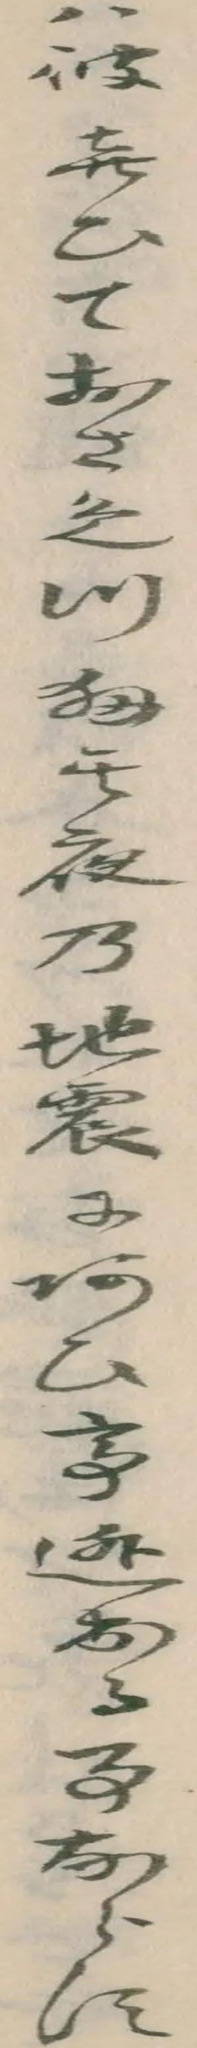は彼喜ひておさめつ扨其夜の地震にあひて逃出る事ならす

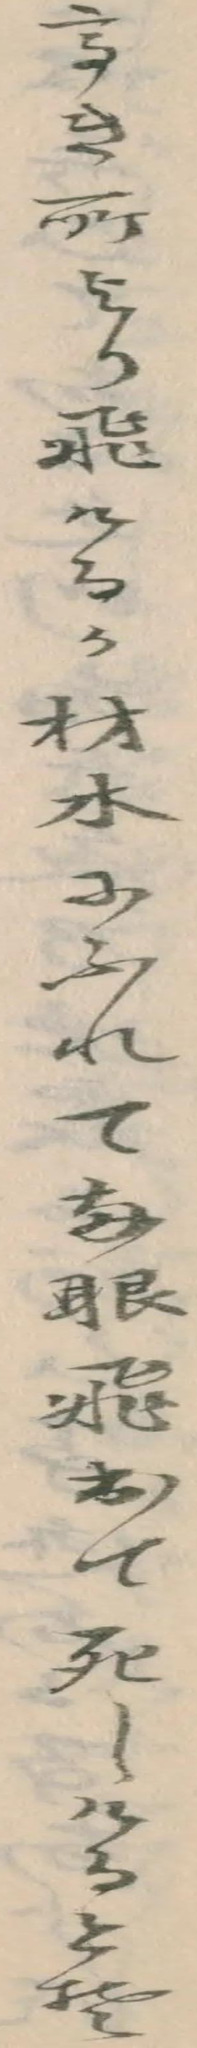高き所より飛けるか材木にふれて両眼飛出て死しけるとそ
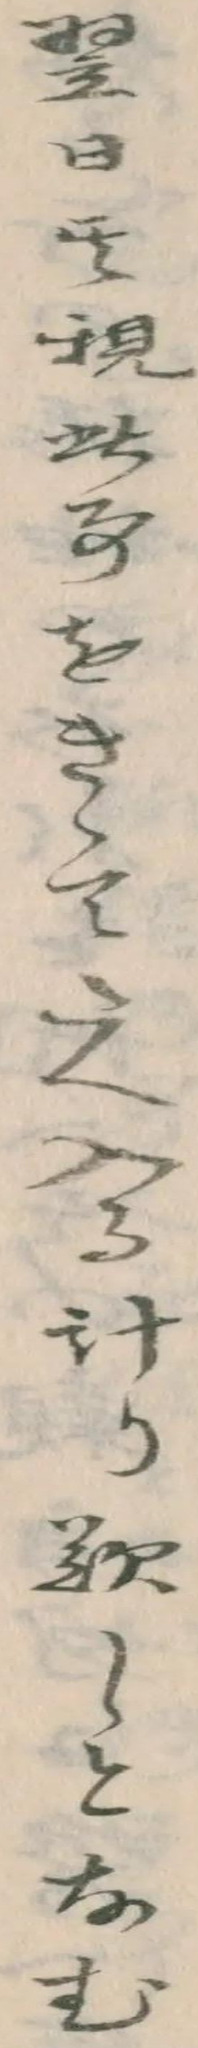翌日其親此事をきゝてたへ入る計り歎しとなむ
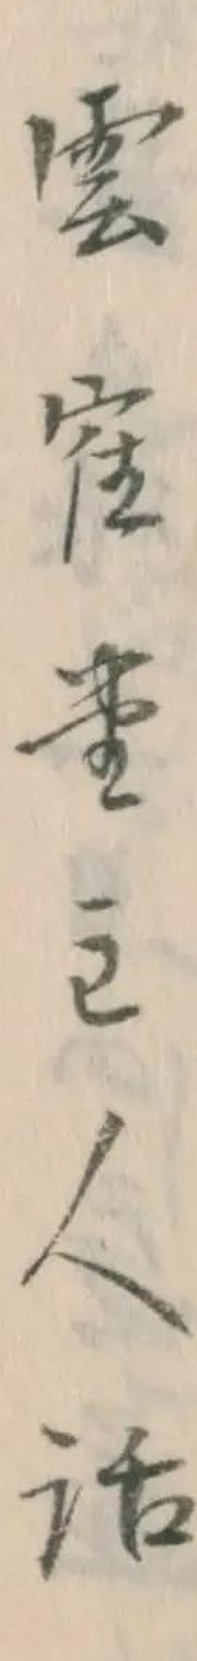雲隺堂主人話
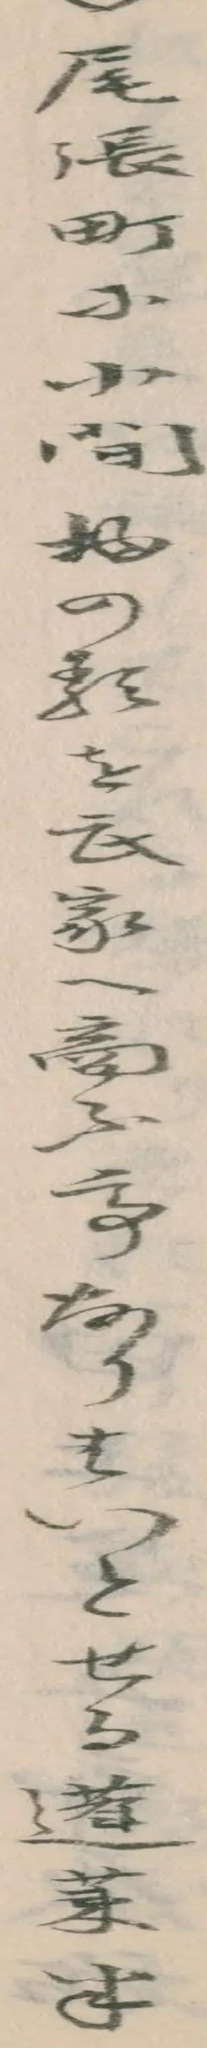〇尾張町に小間物の類を武家へ商ふてなりはいとせる蓬莱半
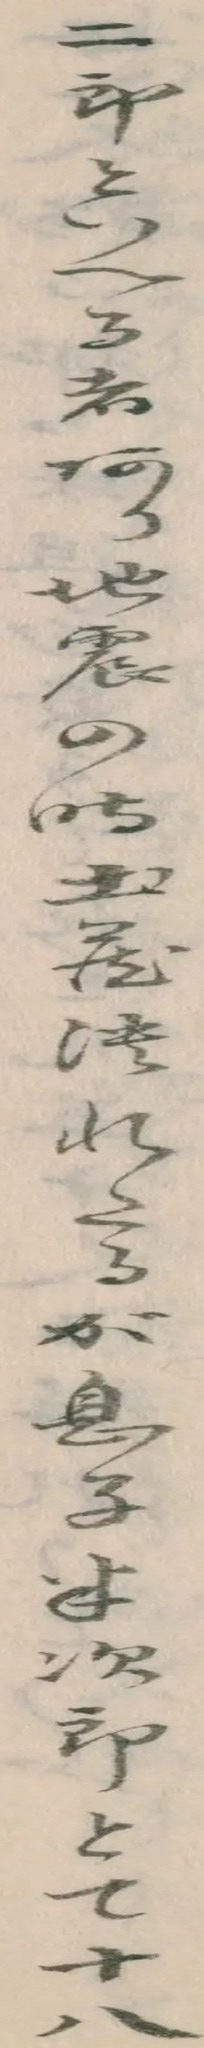二郎といへる者あり地震の時土蔵潰れたるが息子半次郎とて十八
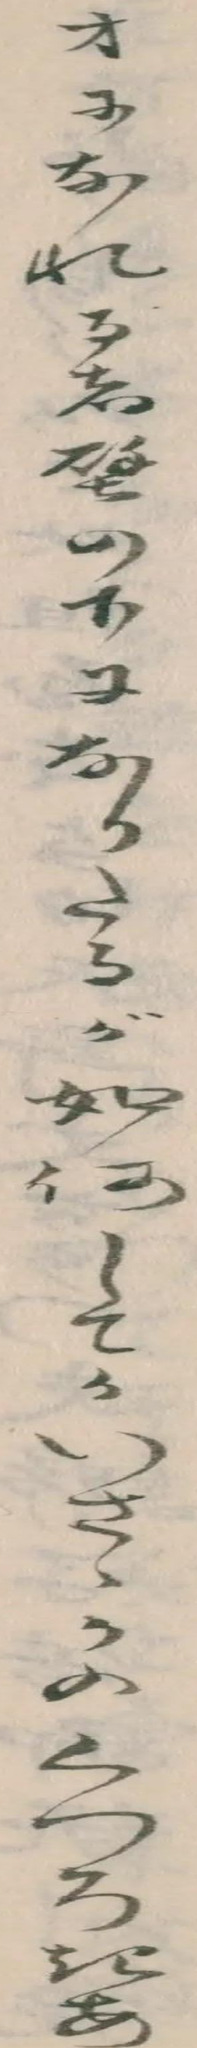才になれる者壁の下になりたるが如何してかいさゝかのくつろきあ
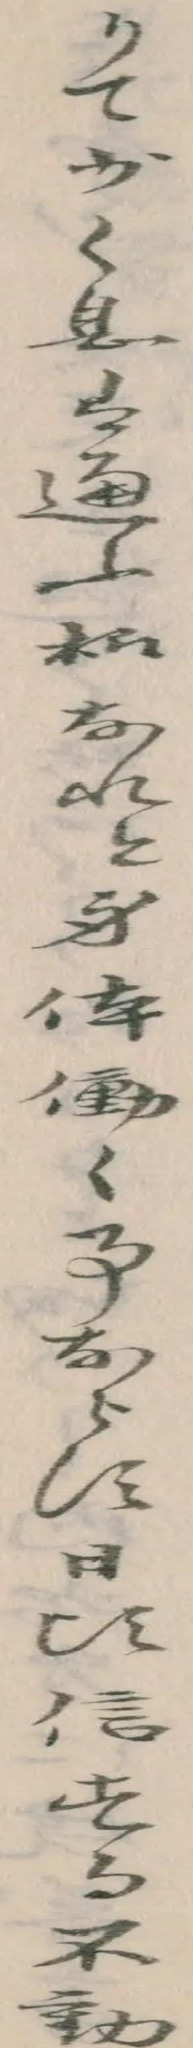りて少く息は通ふ様なれと身体働く事ならす日頃信する不動
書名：地災撮要. 巻7-9(地震之部)
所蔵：国立国会図書館 National Diet Library, JAPAN
